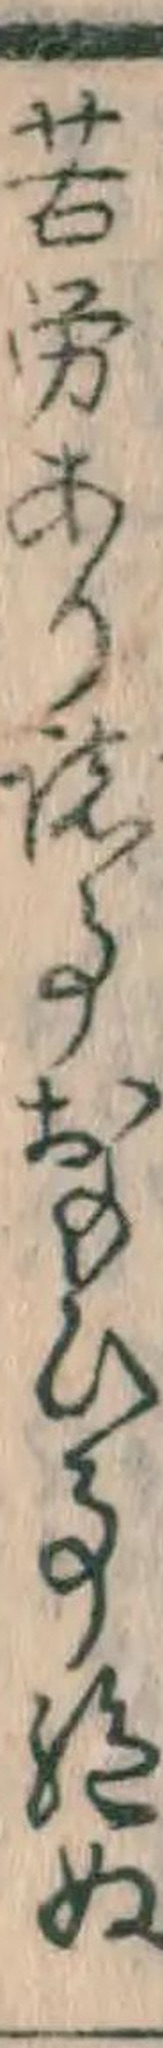苦労あり諸事おもひ事絶ぬ
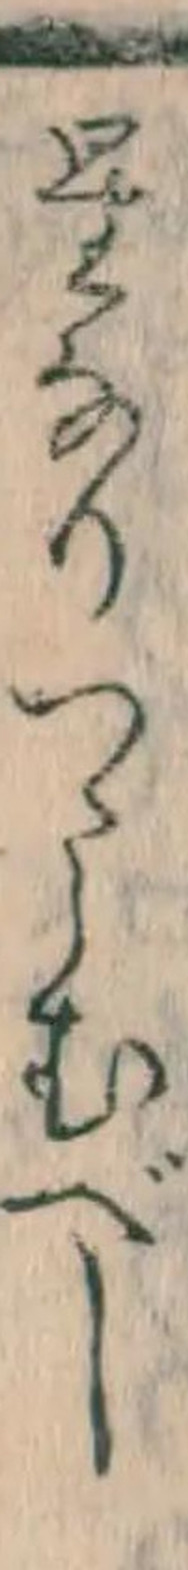星なりつゝしむべし
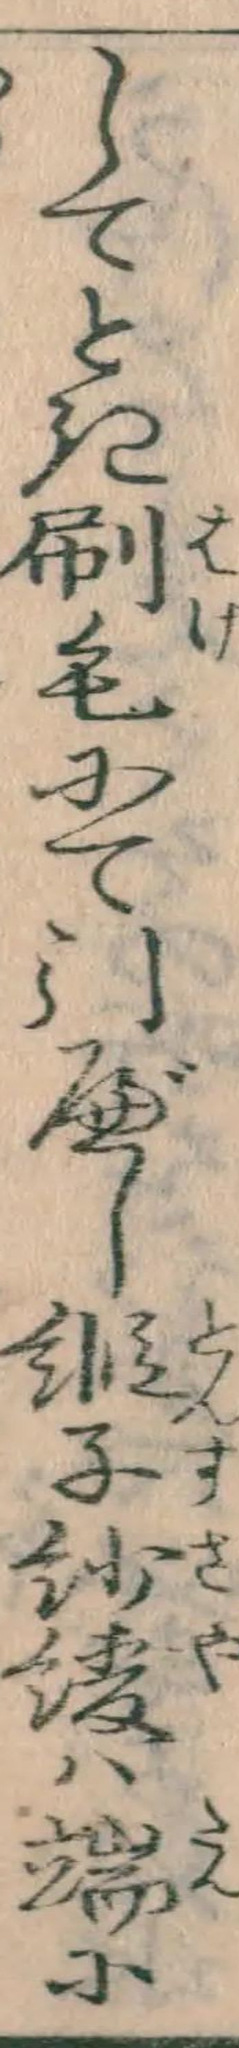してとき刷毛にて引べし緞子紗綾は端に
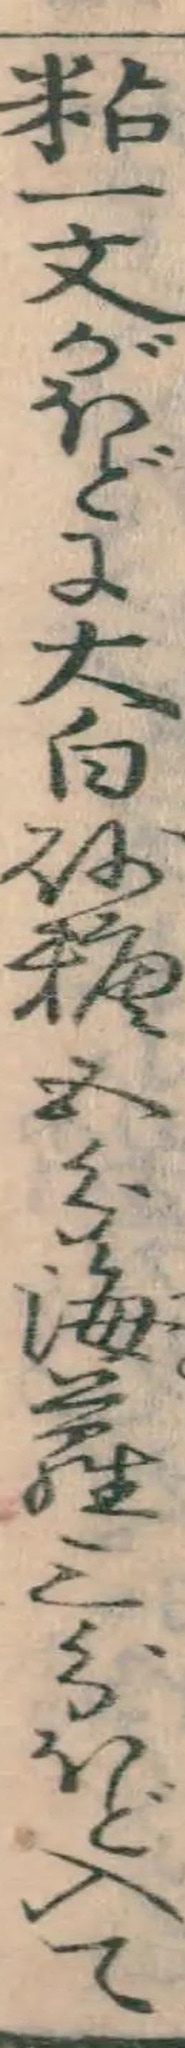粘一文がほどに大白砂糖五分海蘿三分ほど入て
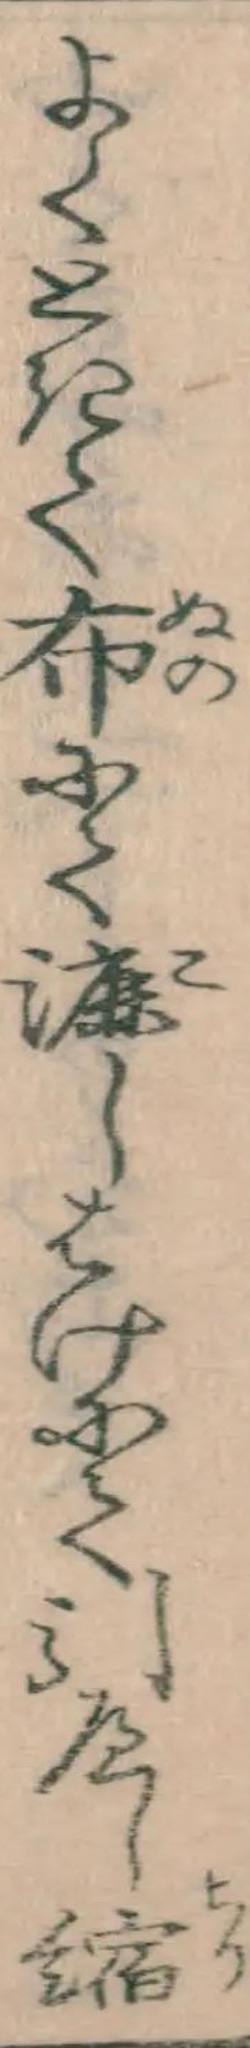よくときて布にて漉しはけにて引へし縮
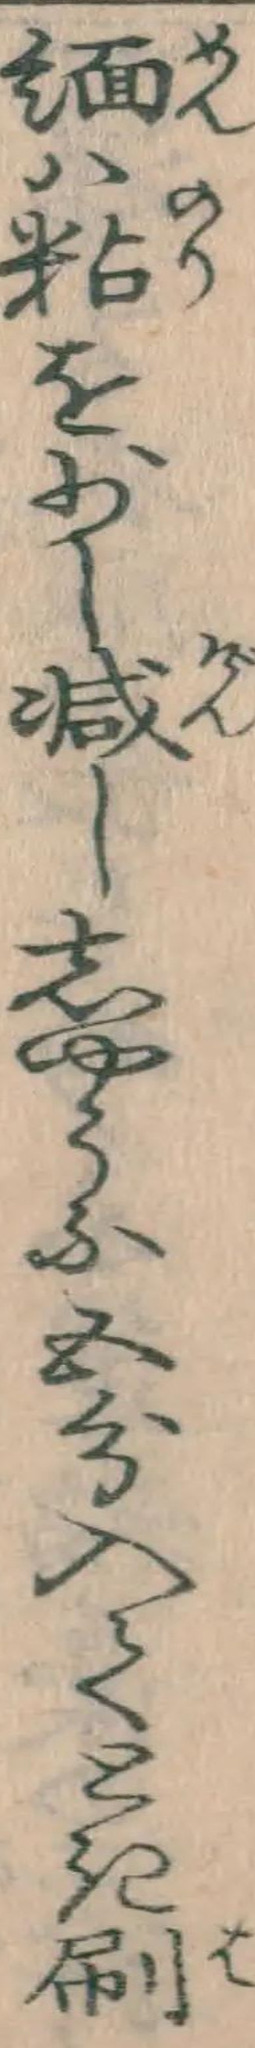緬は粘を少し減ししやうふ五分入てとき刷
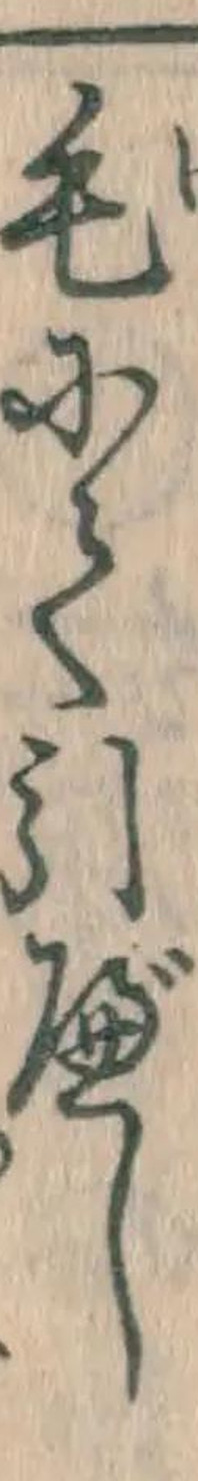毛にて引べし
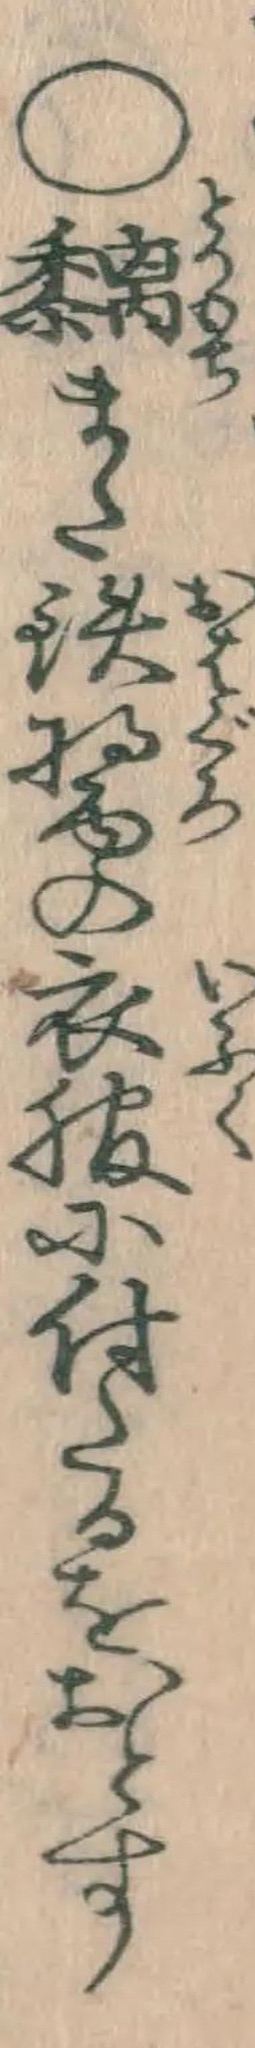○黐また鉄醬の衣服に付たるをおとす
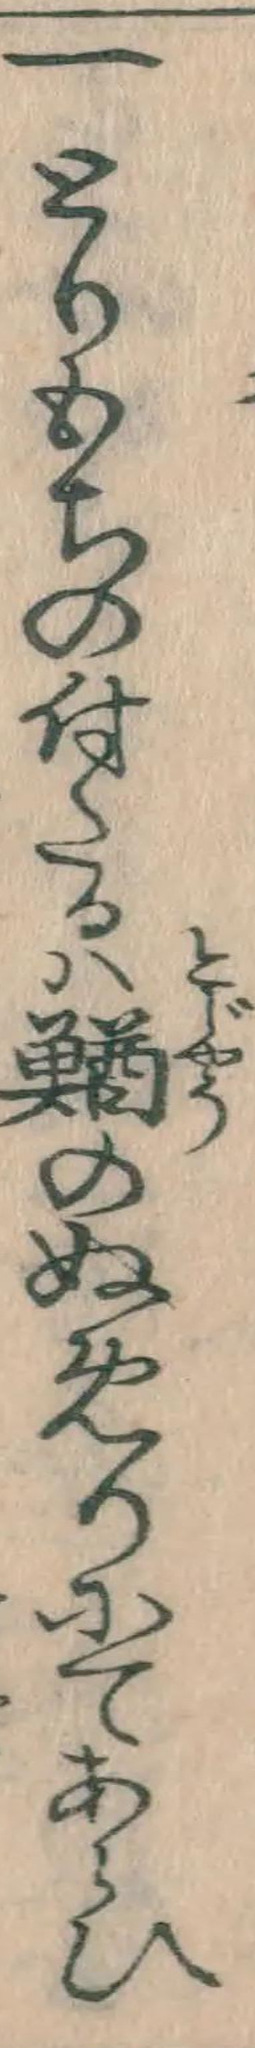一とりもちの付たるは鰌のぬめりにてあらひ
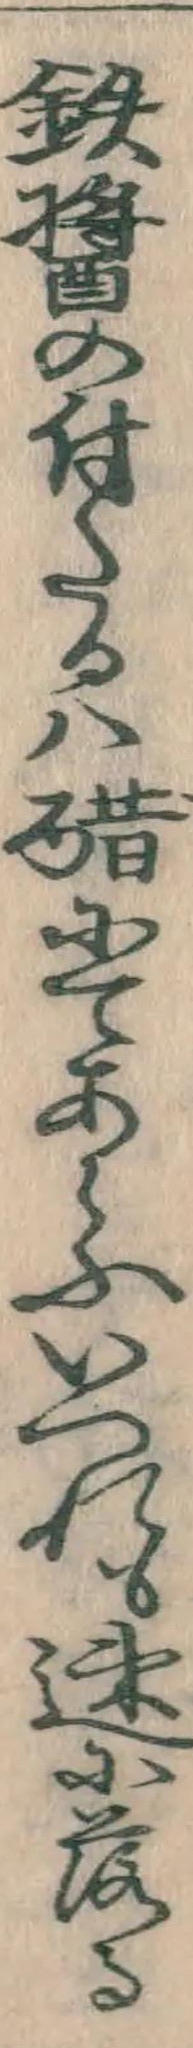鉄醬の付たるは醋にてあらふいつれも速に落る
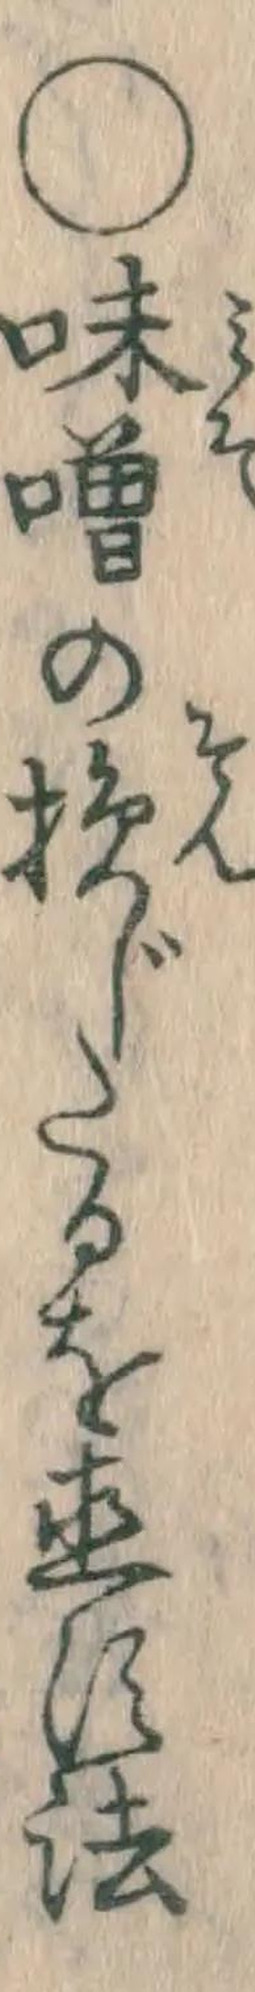○味噌の損じたるを直す法
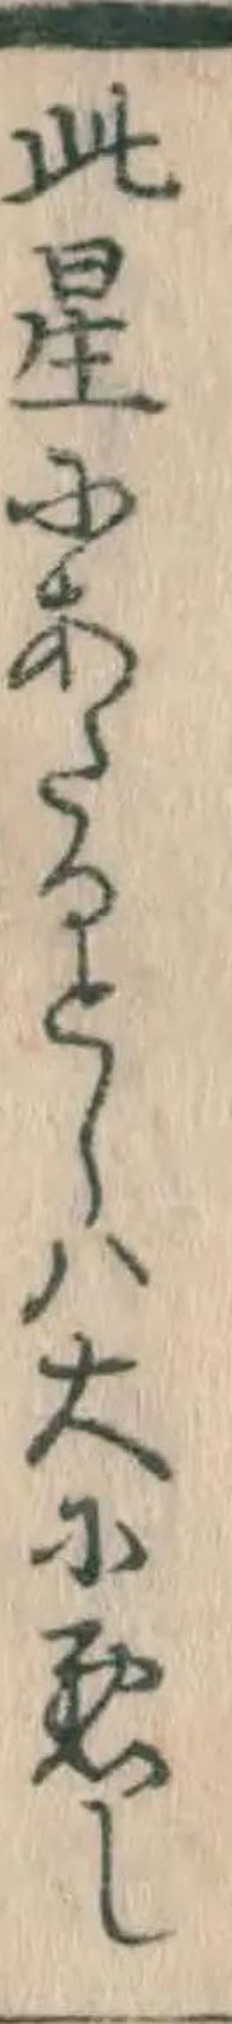此星にあたるとしは大に悪し
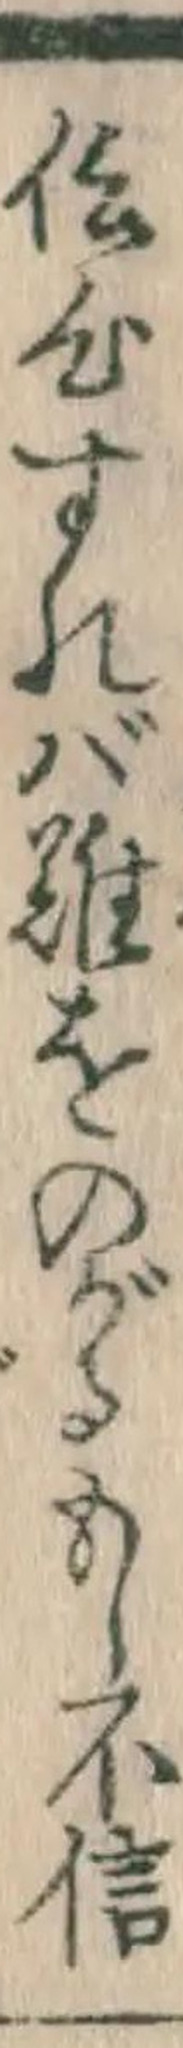信心すれば難をのがるもし不信
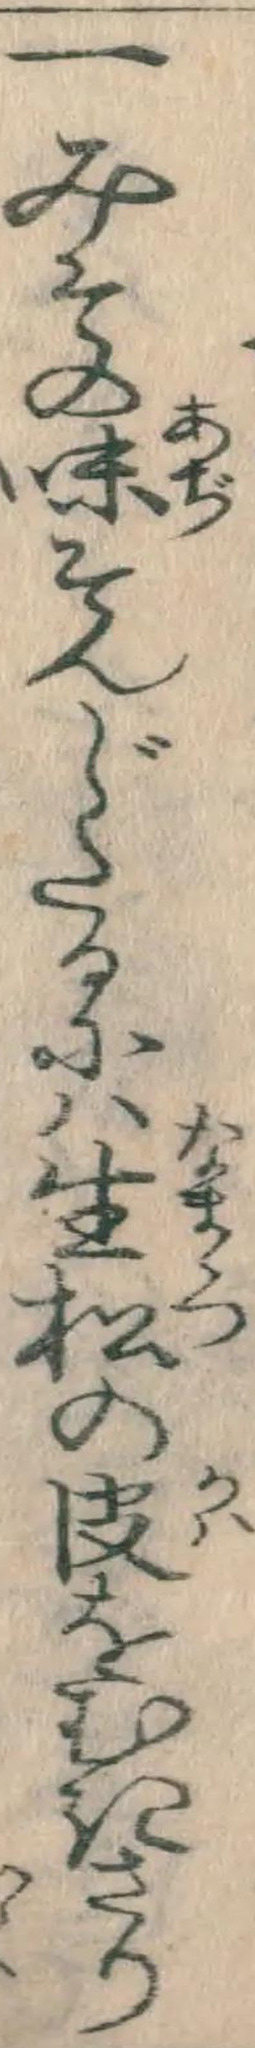一みその味そんじたるには生松の皮をむきさり
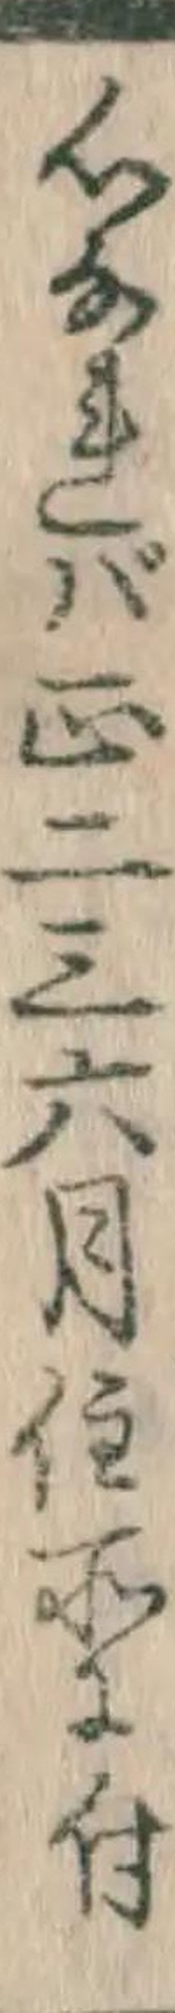心なれば正二三六月住所に付
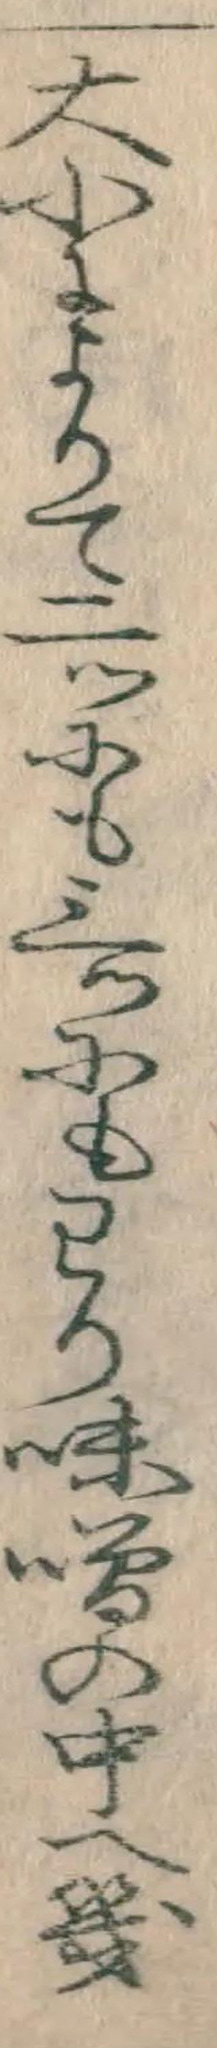大小によりて二ッにも三ッにもわり味噌の中へ幾
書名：広益秘事大全 3巻. [1]
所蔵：国立国会図書館 National Diet Library, JAPAN
